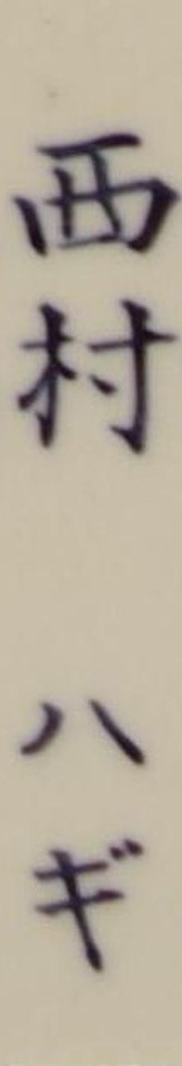西村ハギ
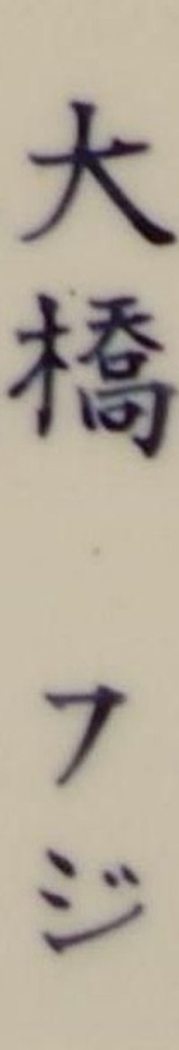大橋フジ
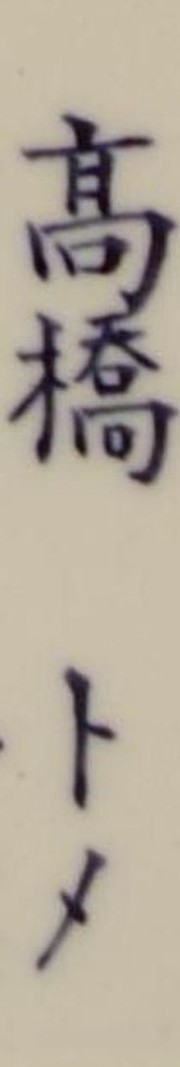高橋トメ
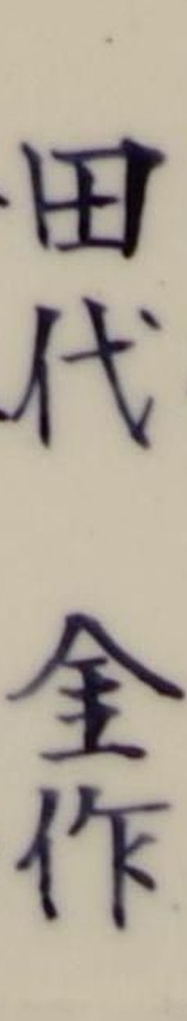田代金作
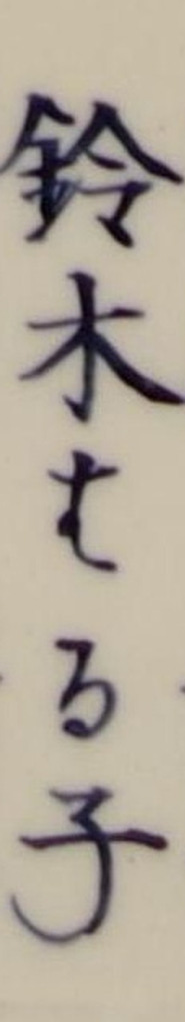鈴木はる子
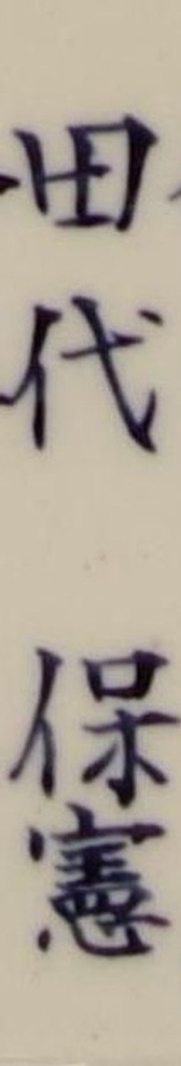田代保憲
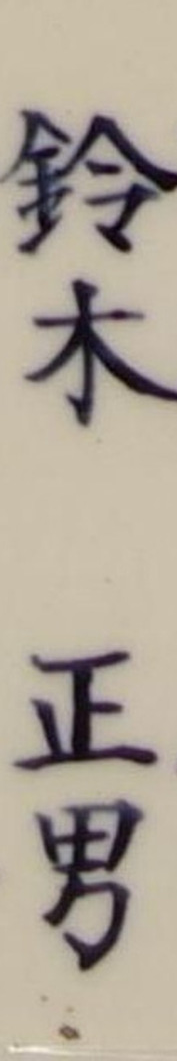鈴木正男
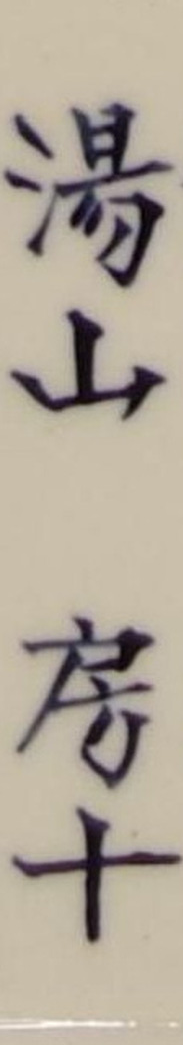湯山房十
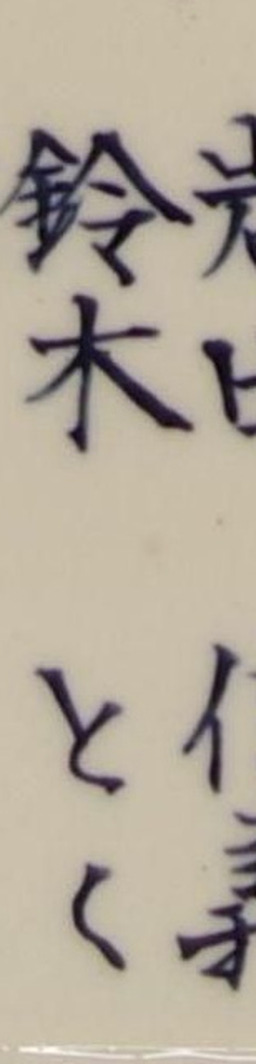鈴木とく
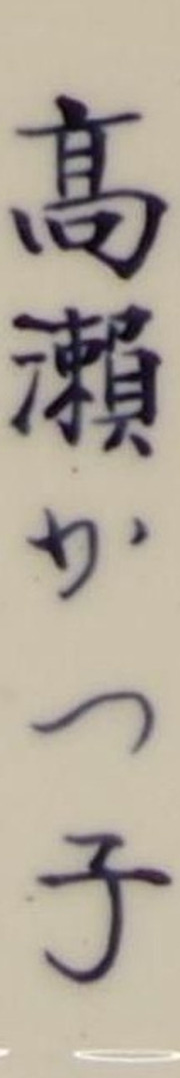高瀬かつ子
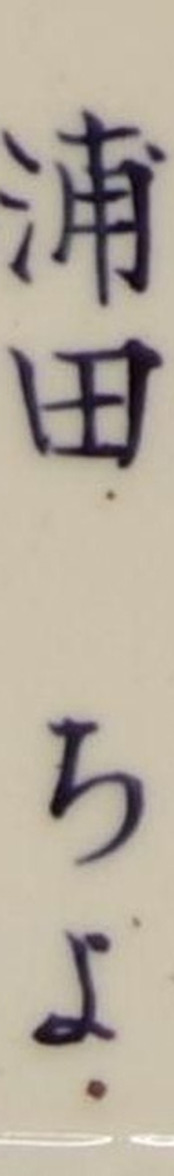浦田ちよ
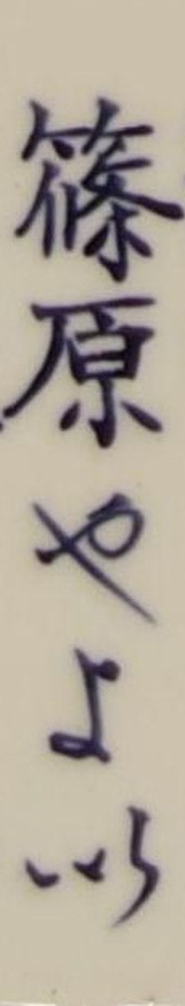篠原やよい
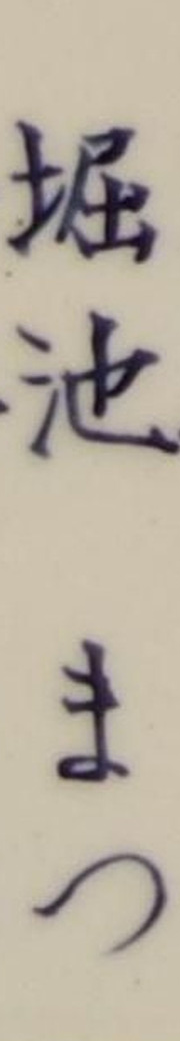堀池まつ

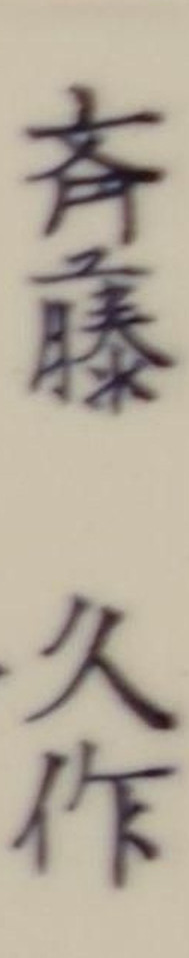斉藤久作
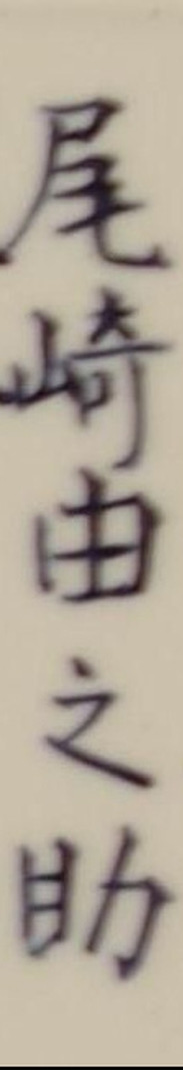尾崎由之助
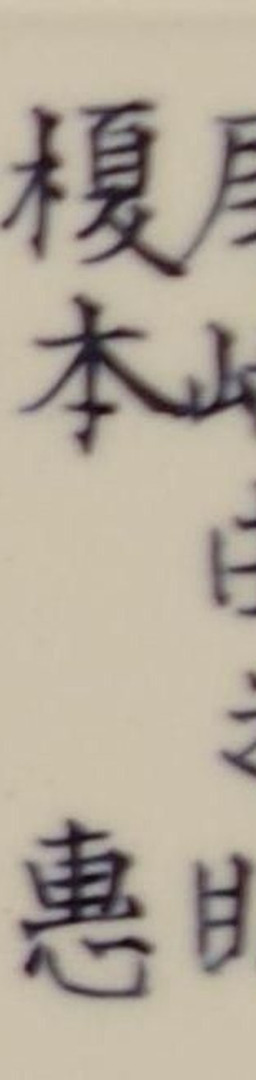榎本恵
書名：M~S
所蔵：高野山金剛峯寺
